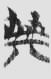典
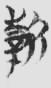新
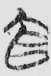官
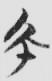帀（師）
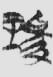瑗
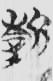新
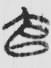官
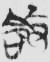○（令）
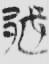○（越）
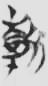新
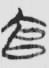官
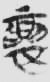婁
